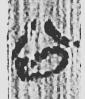公
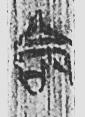命
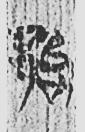邭
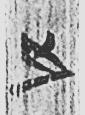之
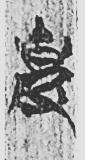尅
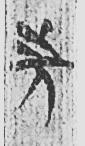先
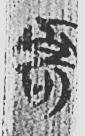{口甹}
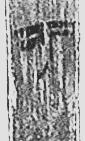于
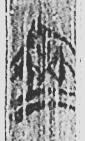齊
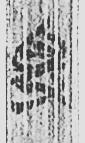{且又}
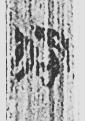卲
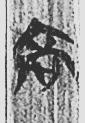高
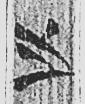之
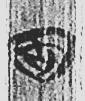固
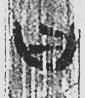曰
